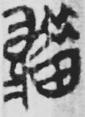鵲
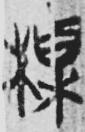樔（巢）
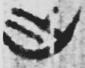出
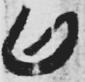㠯（以）
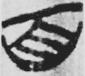百
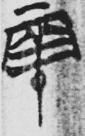两（辆）
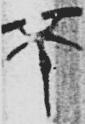不
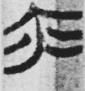亦
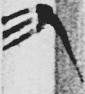又（有）
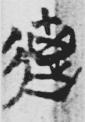○（離）
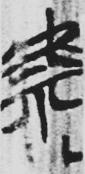{虍示}（乎）
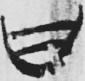甘
